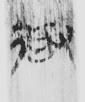{彳取}
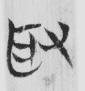取
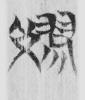{歹翏}
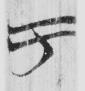于
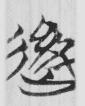後
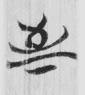至
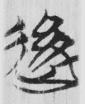後
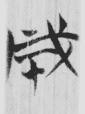成
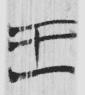王
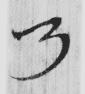乃
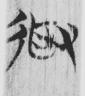{彳取}
